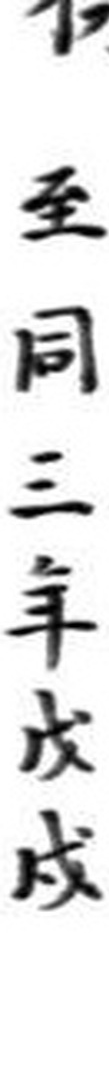至同三年戊戌

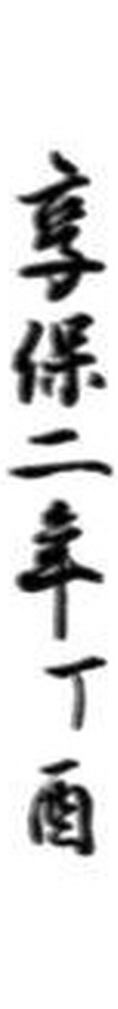享保二年丁酉
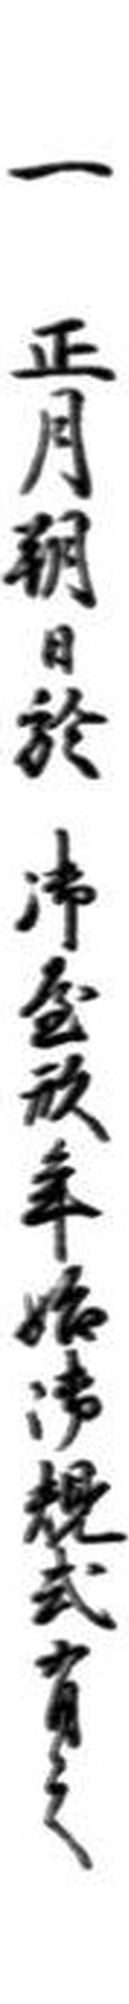一正月朔日於御屋形年始御規式有之
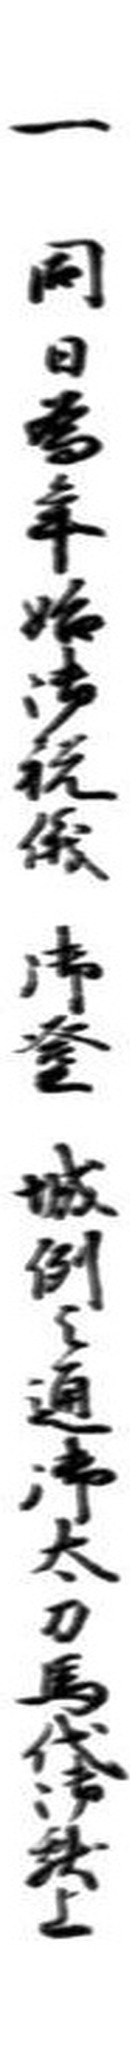一同日為年始御祝儀御登城例之通御太刀馬代御献上
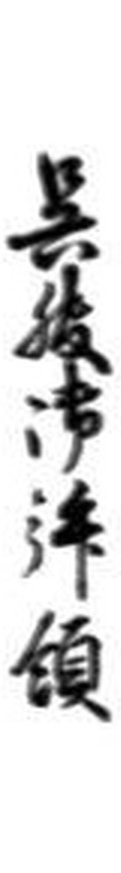呉服御拝領
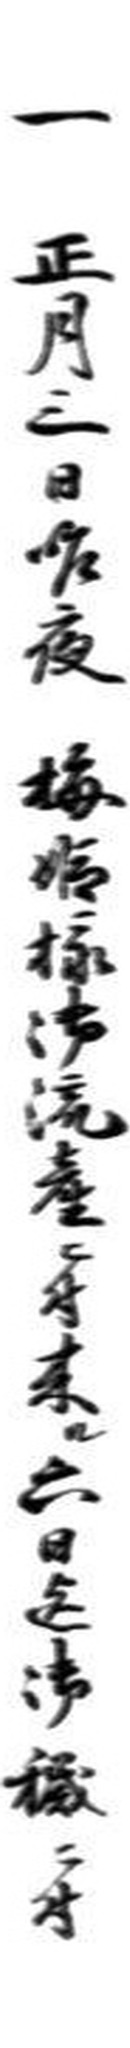一正月三日昨夜梅姫様御流産ニ付来ル六日迄御穢ニ付
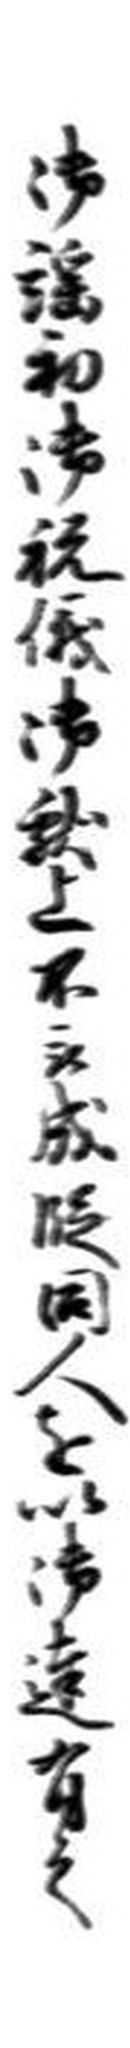御謡初御祝儀御献上不被成段同人を以御達有之

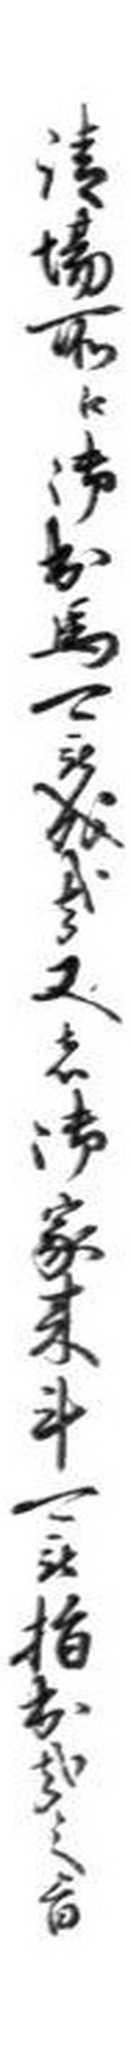請場所江御出馬可被成哉又者御家来斗可被指出哉之旨
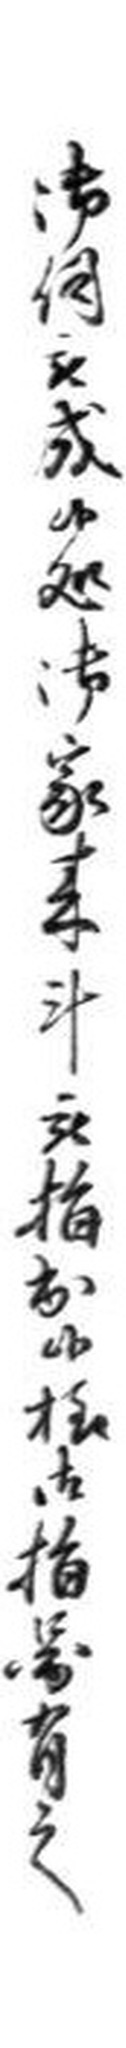御伺被成候処御家来斗被指出候様御指図有之
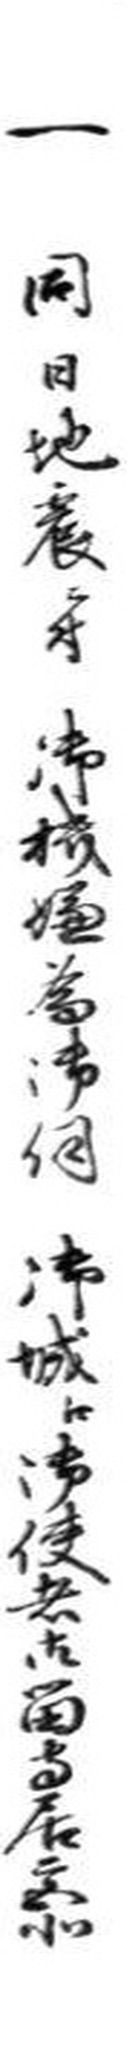一同日地震ニ付御機嫌為御伺御城江御使者御留守居宮北
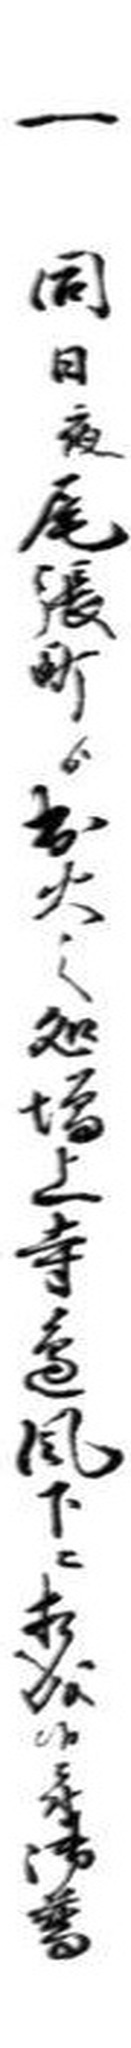一同日夜尾張町ゟ出火之処増上寺辺風下ニ相成候ニ付御普
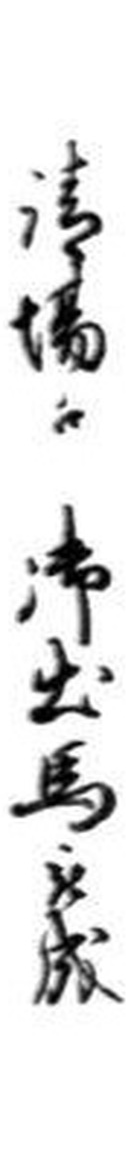請場江御出馬被成
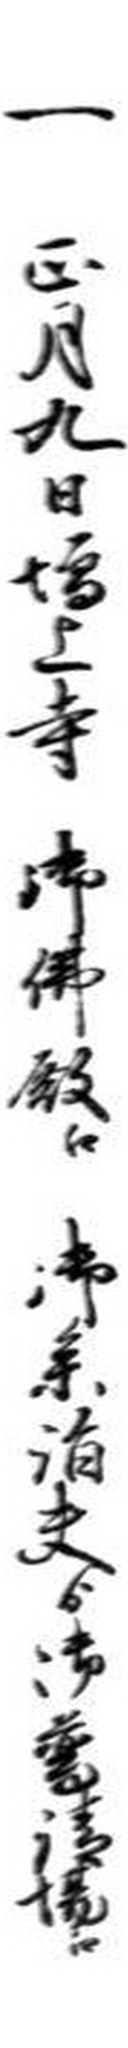一正月九日増上寺御仏殿江御参詣夫ゟ御普請場江
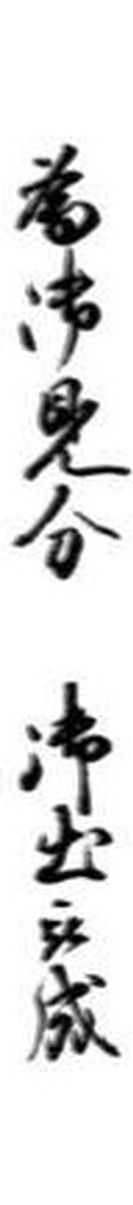為御見分御出被成
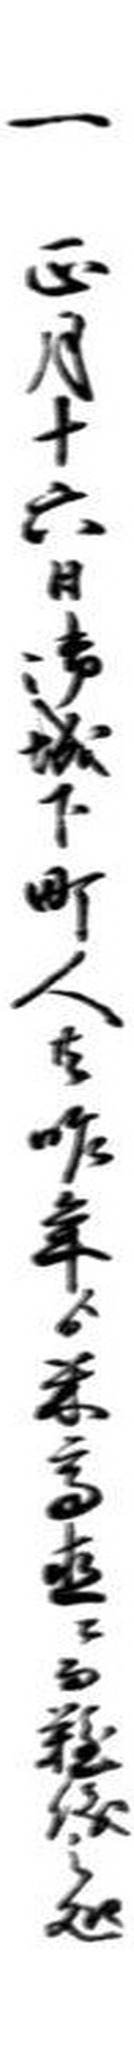一正月十六日御城下町人共昨年ゟ米高直ニ而難儀之処
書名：家譜 三十二 吉邦公 従享保二年到享保三年
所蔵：福井県文書館 Fukui Prefectural Archives
